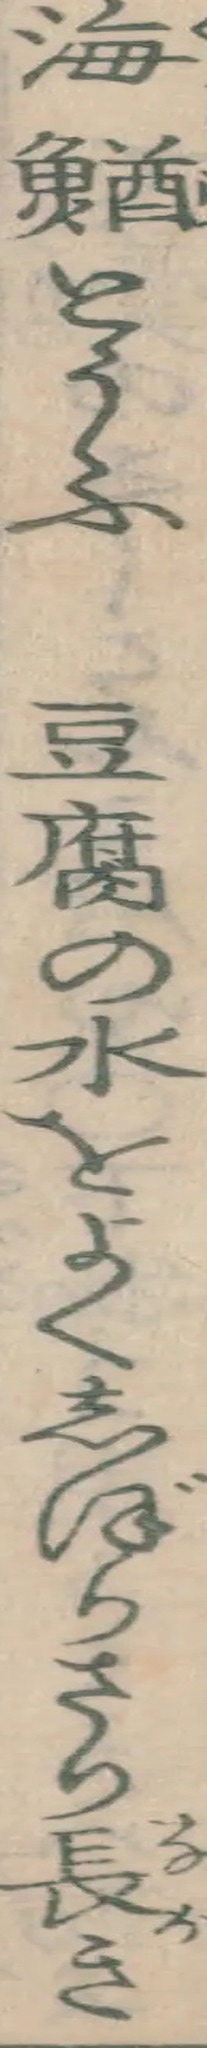卅三海鰌とうふ豆腐の水をよくしぼりさり長き
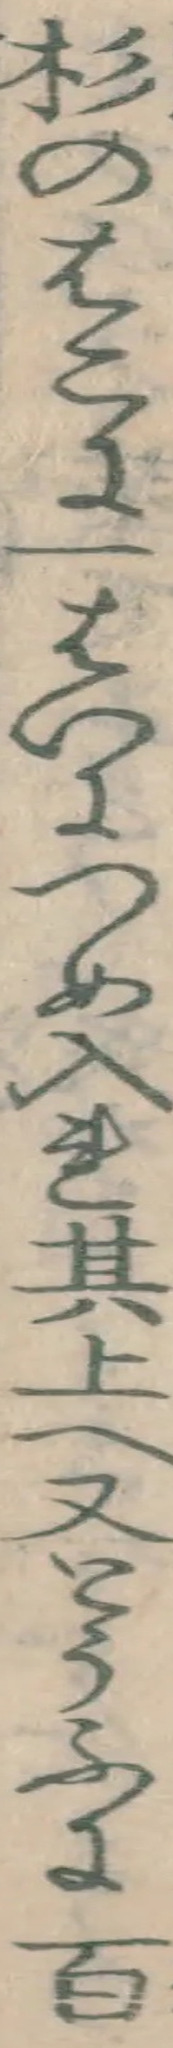杉のはこに一はいにつめ入れ其上へ又とうふに百
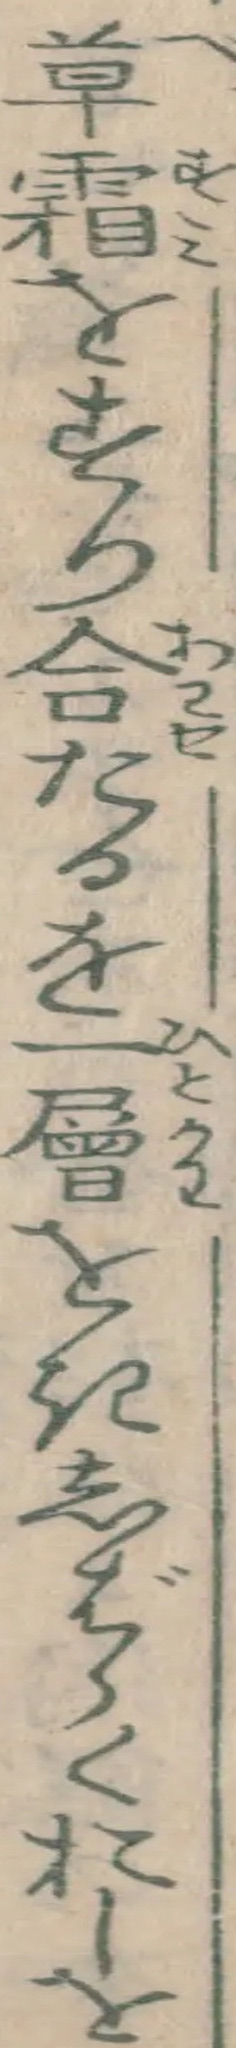草霜をすり合たるを一層をきしばらくおしを
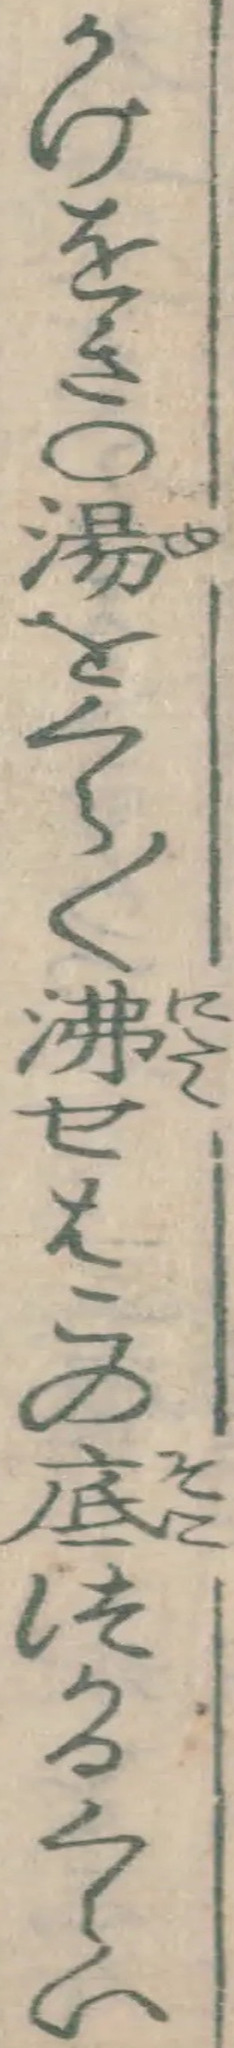かけをき○湯をくら〳〵沸せはこの底つかるくらい
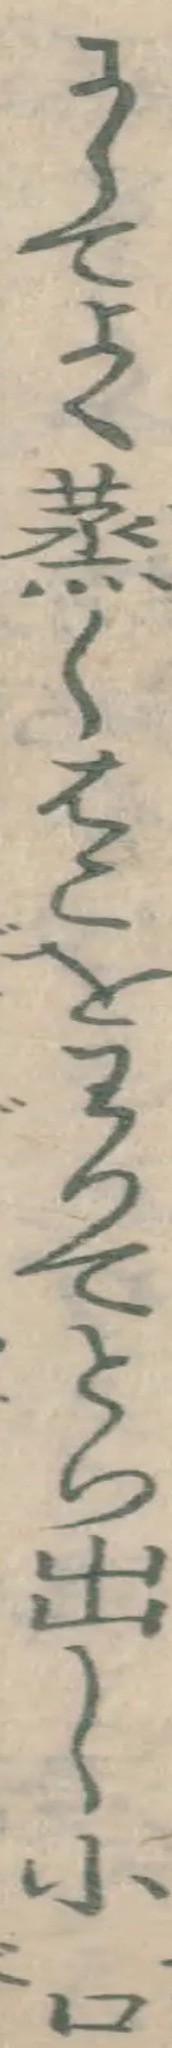にしてよく蒸しはこをわりてとり出し小口
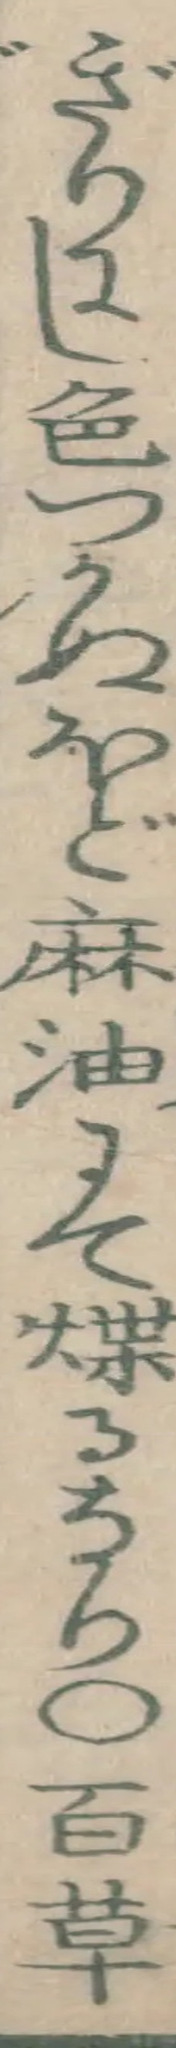ぎりにし色つかぬほど麻油にて煠るなり○百草
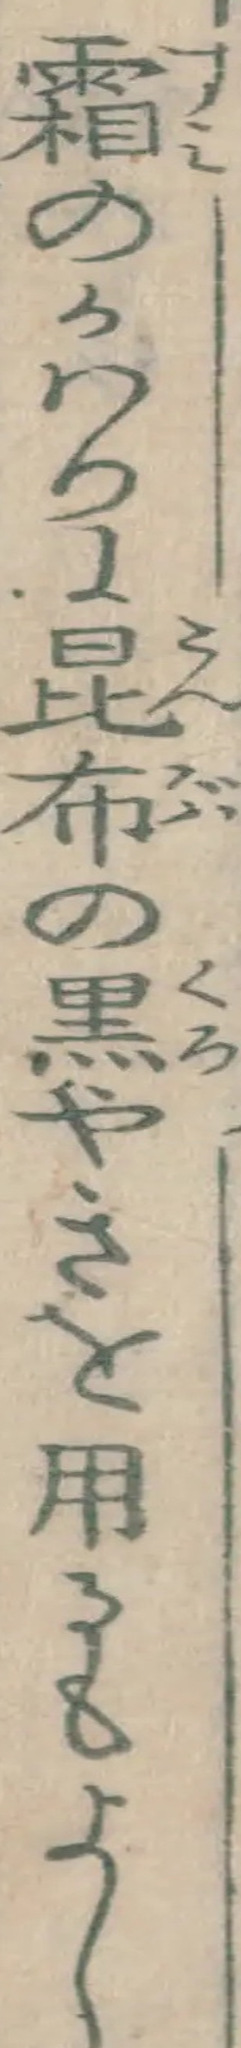霜のかはりに昆布の黒やきを用るもよし
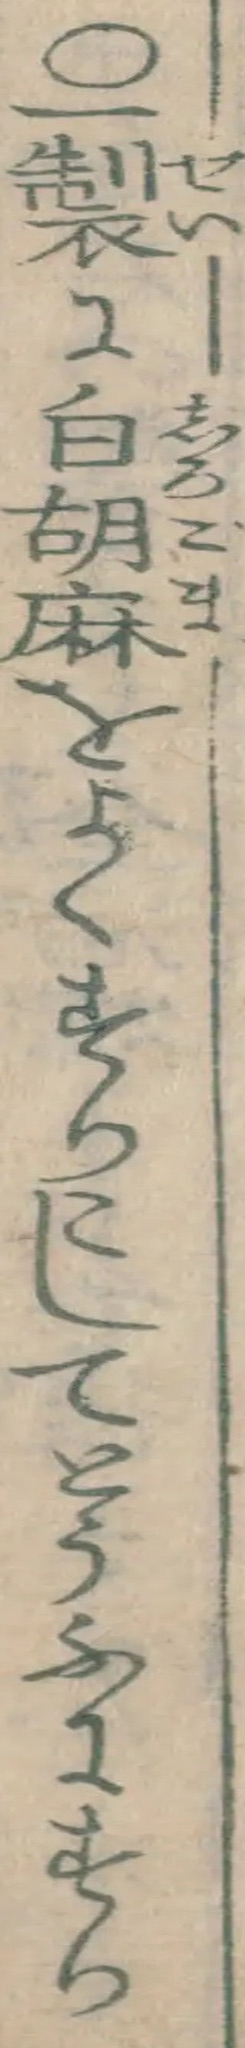○一製に白胡麻をよくすりこしてとうふにすり

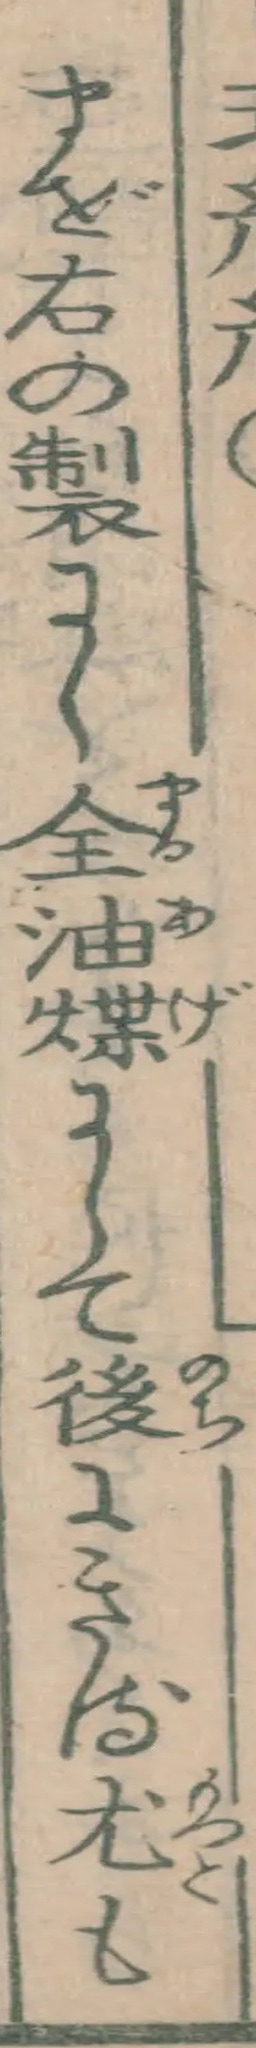まぜ右の製にし全油煠にして後にきる尤も
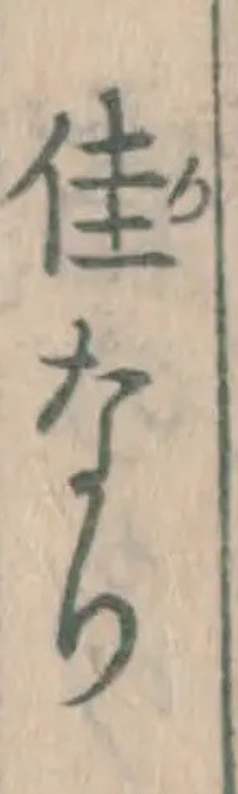佳なり
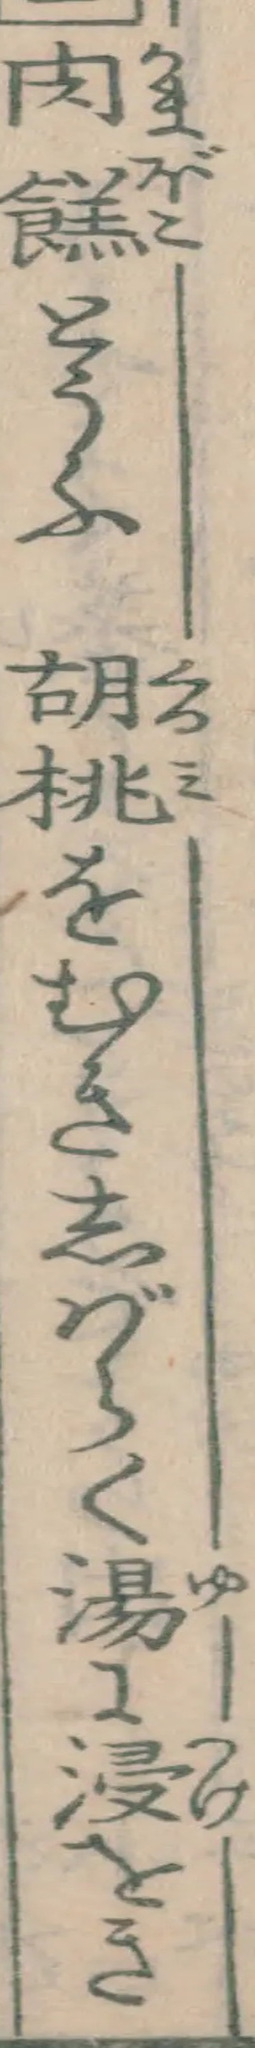卅四肉餻とうふ胡桃をむきしばらく湯に浸をき
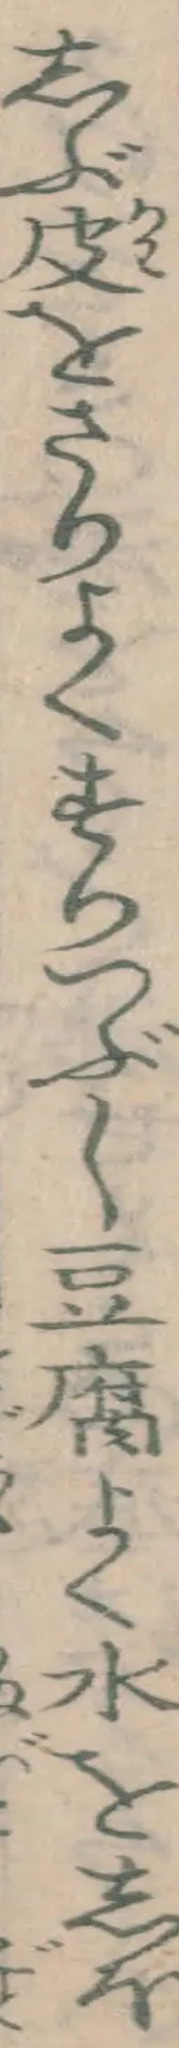しぶ皮をさりよくすりつぶし豆腐よく水をしぼ
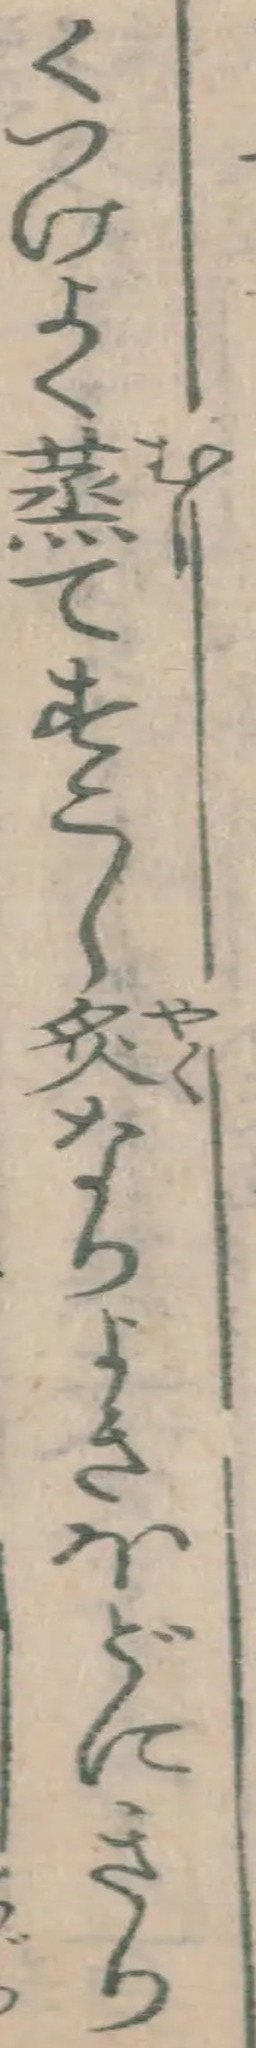くつけよく蒸てすこし炙なりよきほどにきり
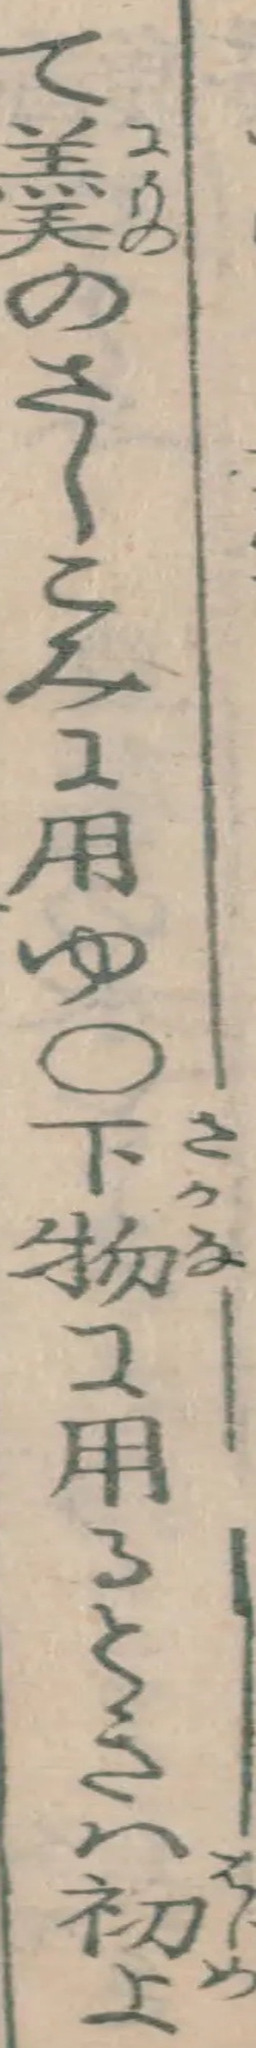て羹のさしこみに用ゆ○下物に用るときは初よ
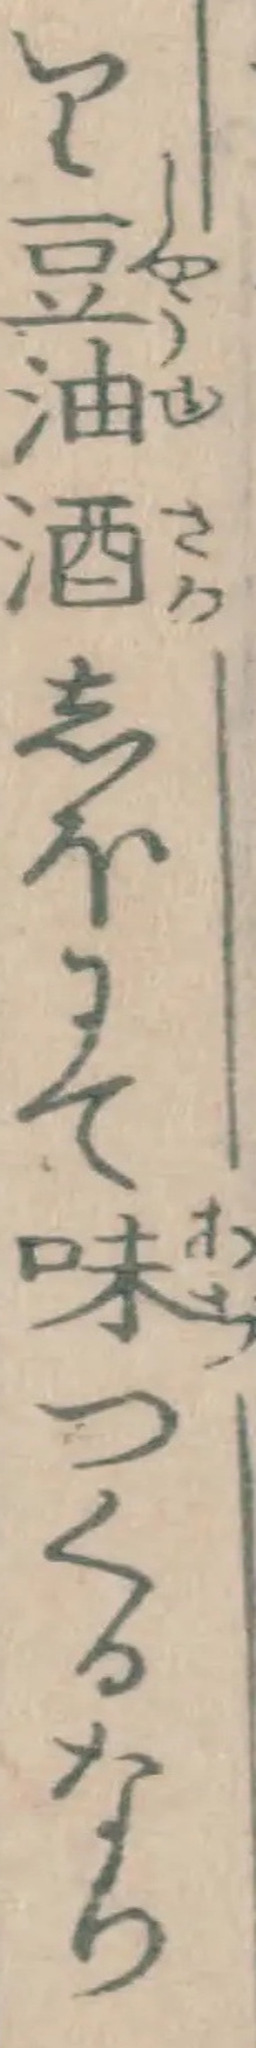り豆油酒しほにて味つくるなり
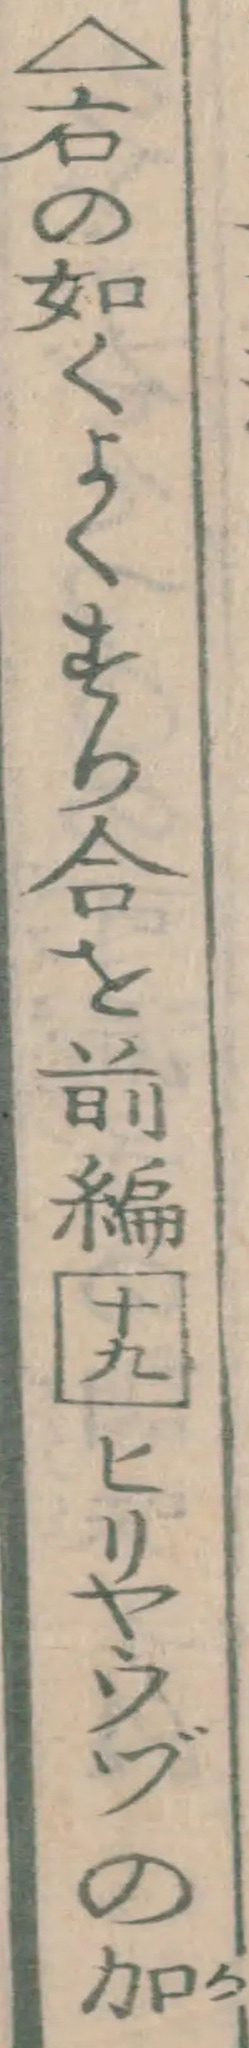△右の如くよくすり合せ前編十九ヒリヤウヅの加
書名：豆腐百珍. 続編
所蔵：国立国会図書館 National Diet Library, JAPAN
